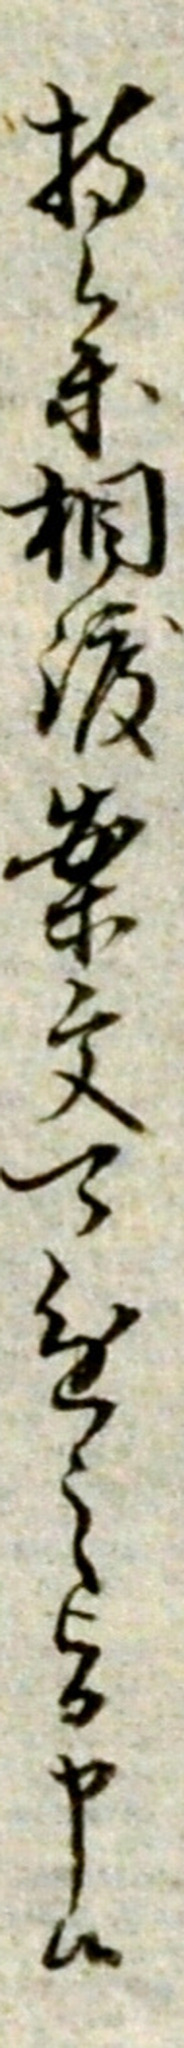持参相渡案文可進之旨申候
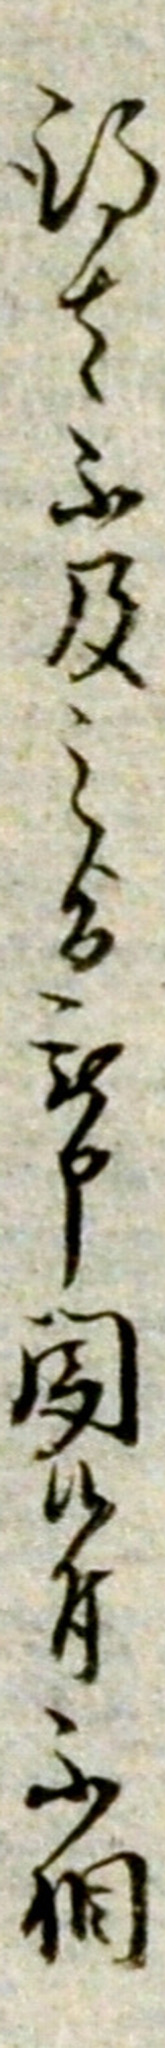得者不及之旨被申聞候付不相
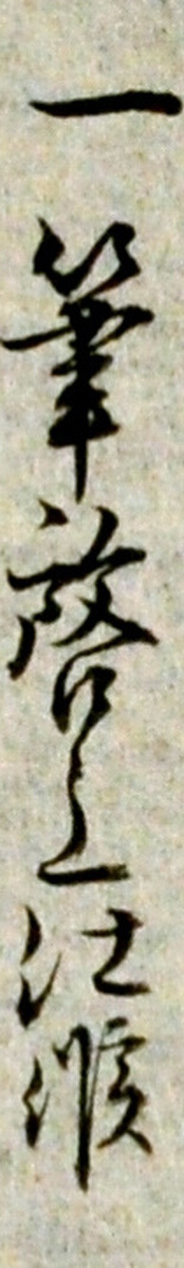一筆啓上仕候
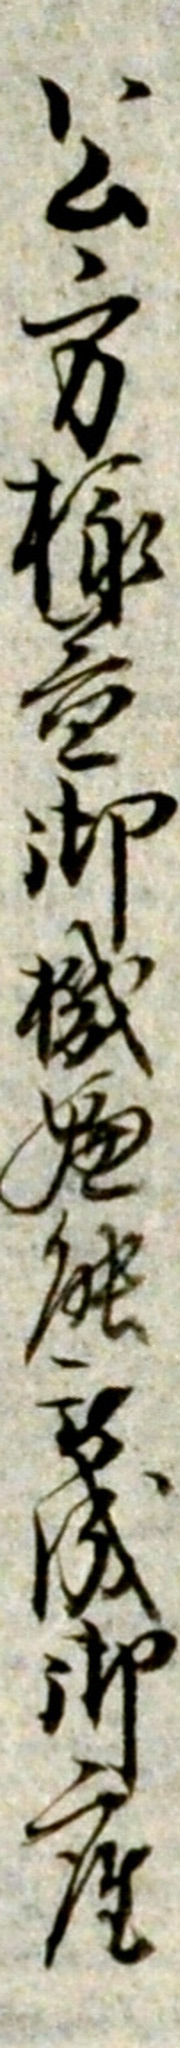公方様益御機嫌能被成御座
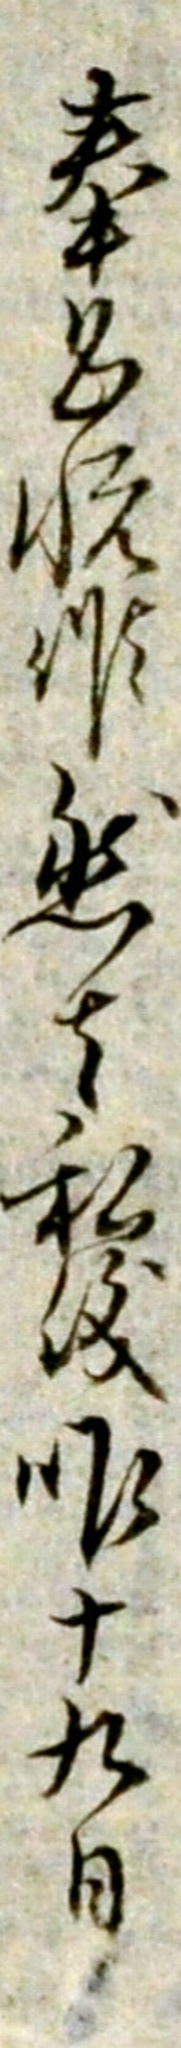奉恐悦候然者私儀昨十九日
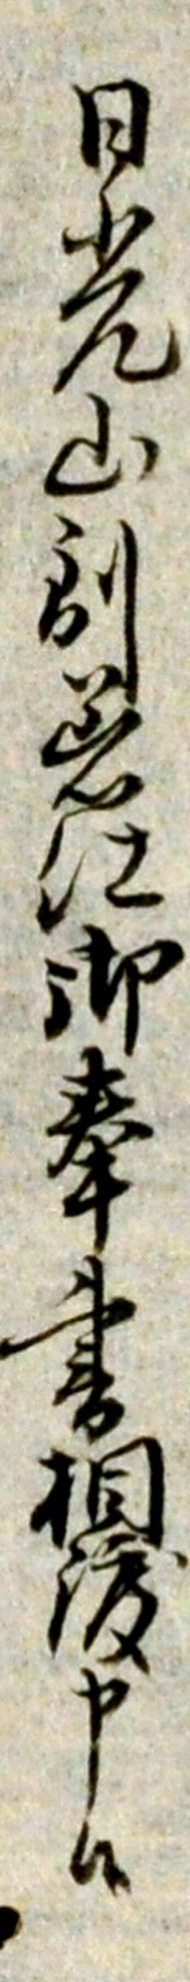日光山到着仕御奉書相渡申候
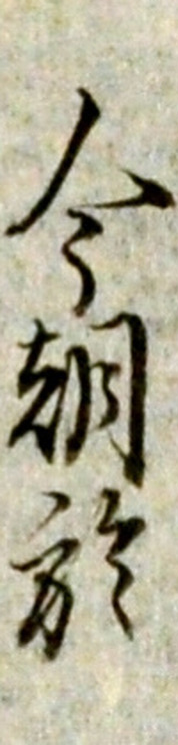今朝於
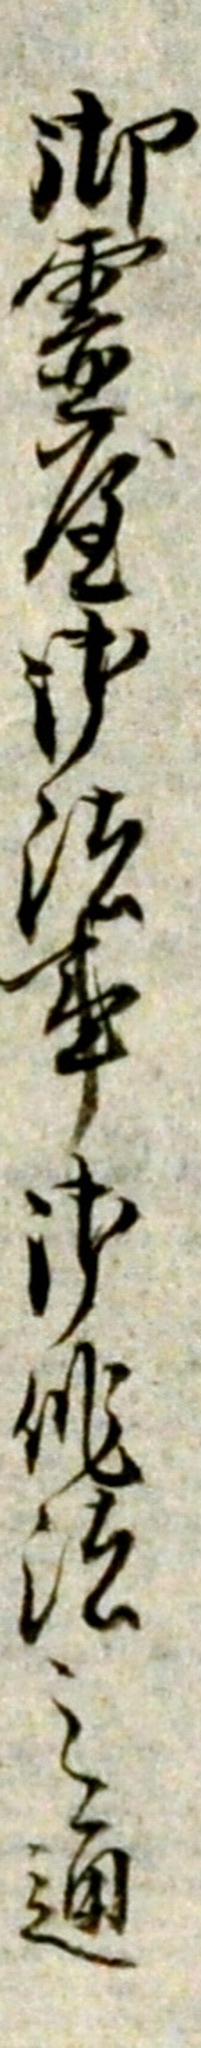御霊屋御法事御作法之通
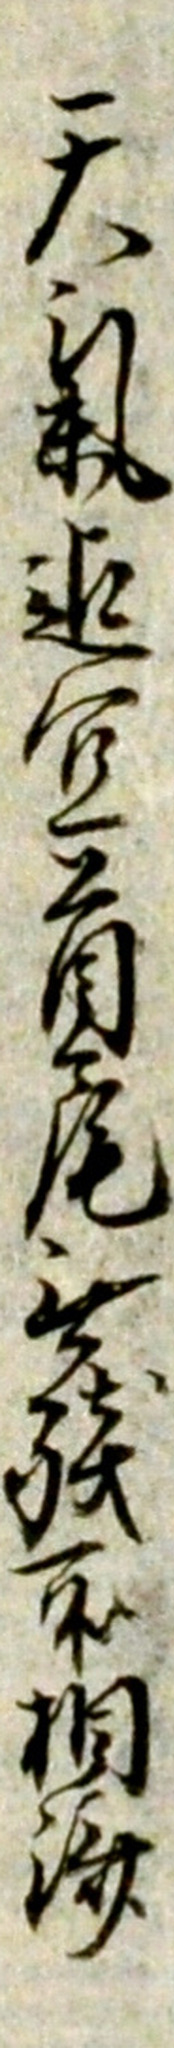天気迄宜首尾無残所相済
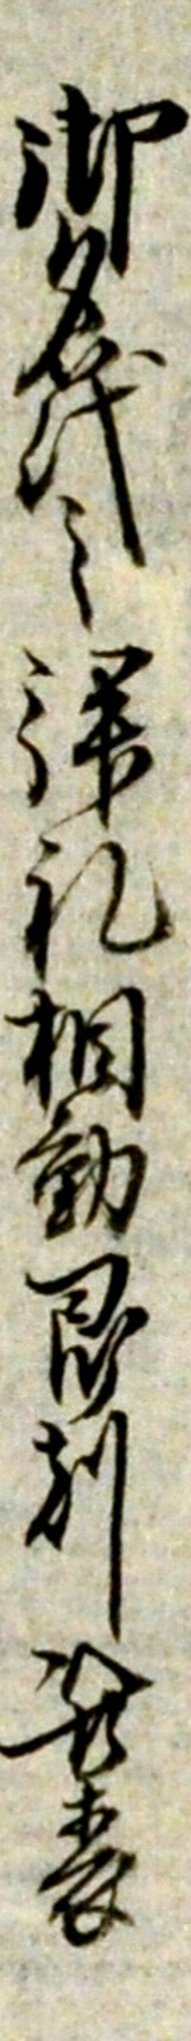御名代之拝礼相勤即刻此表
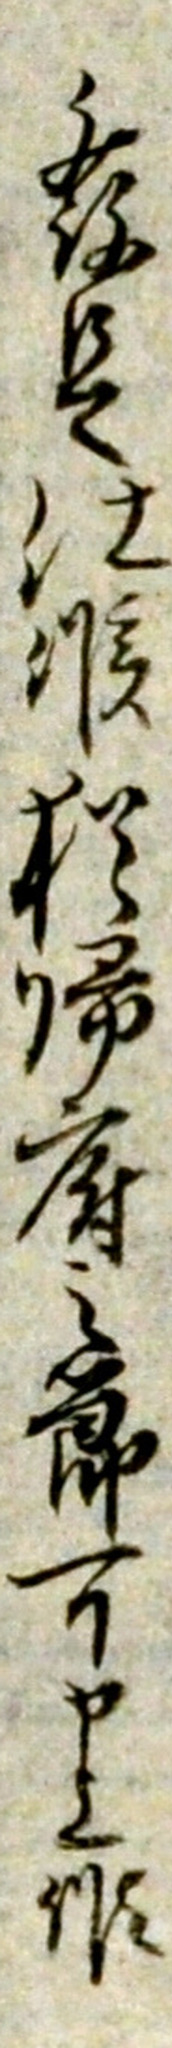発足仕候猶帰府之節可申上候
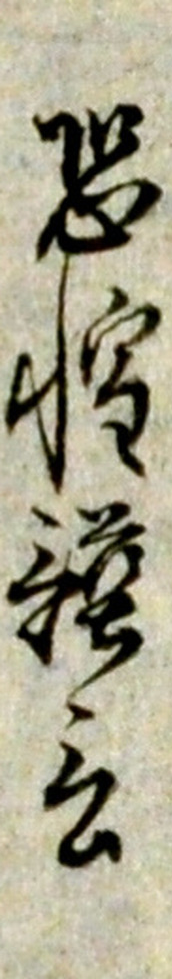恐惶謹言
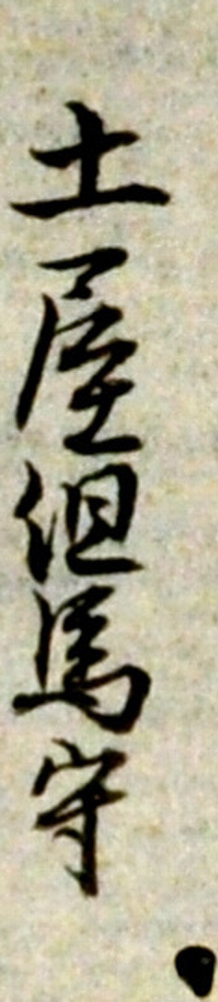土屋但馬守
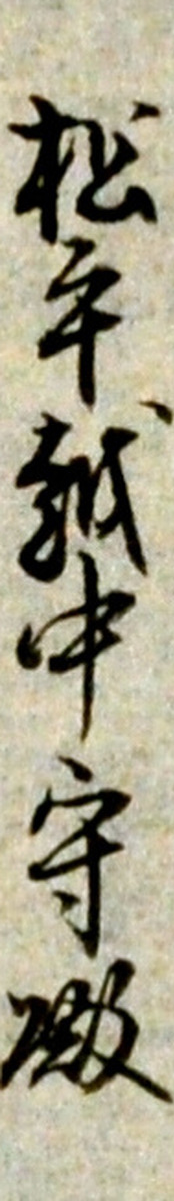松平越中守殿
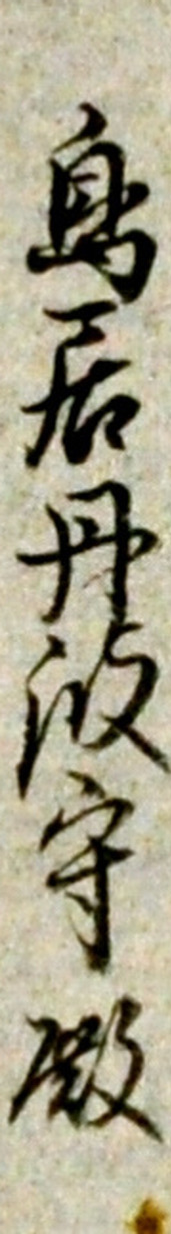鳥居丹波守殿
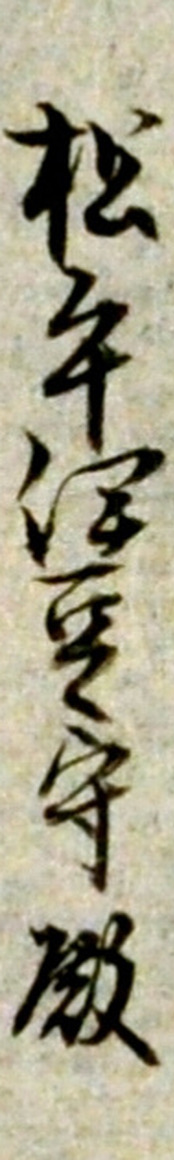松平伊豆守殿
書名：日光御名代相勤候節ノ留
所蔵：伊那市立高遠町図書館・合同会社AMANE
